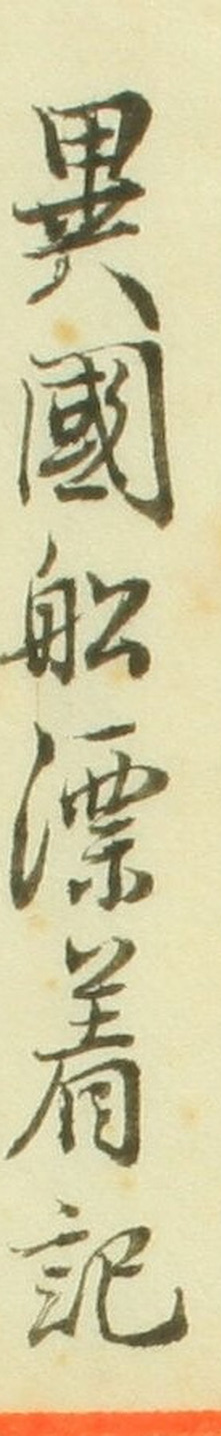異国船漂着記
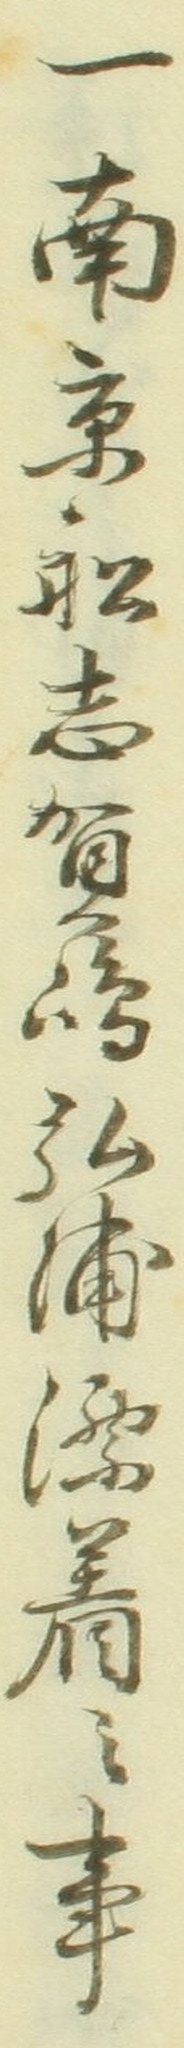一南京船志賀島弘浦漂着之事
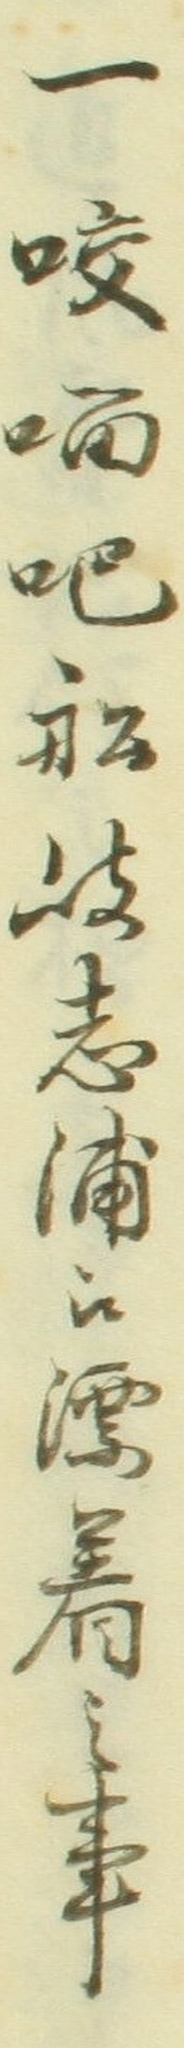一咬𠺕吧船岐志浦え漂着之事

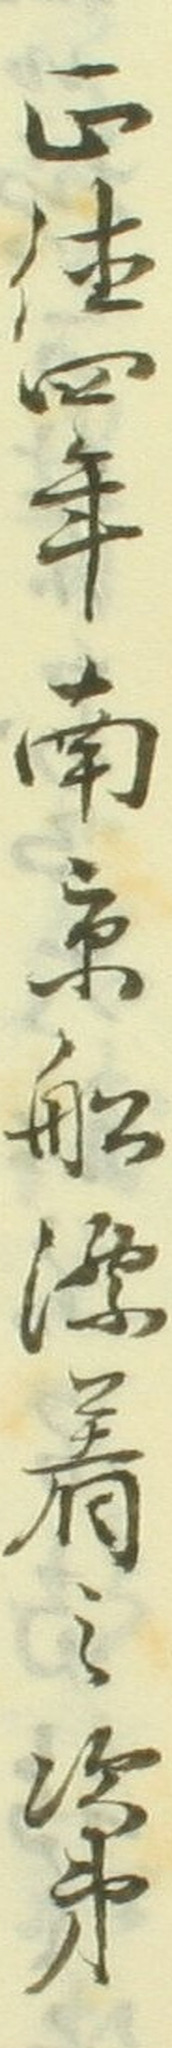正徳四年南京船漂着之次第
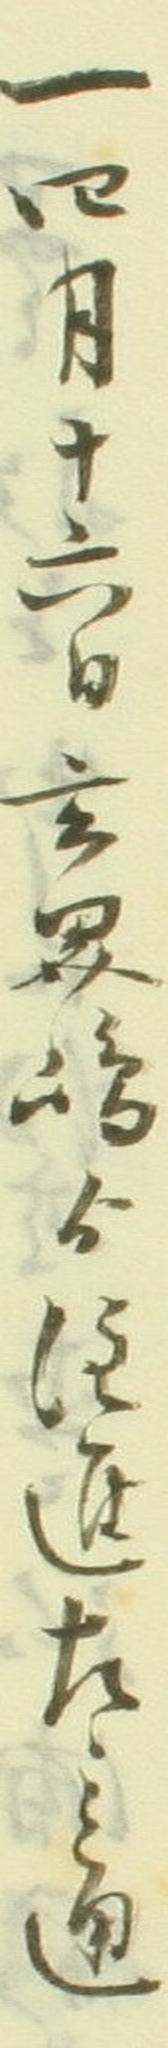一四月十六日玄界嶋ゟ注進左之通
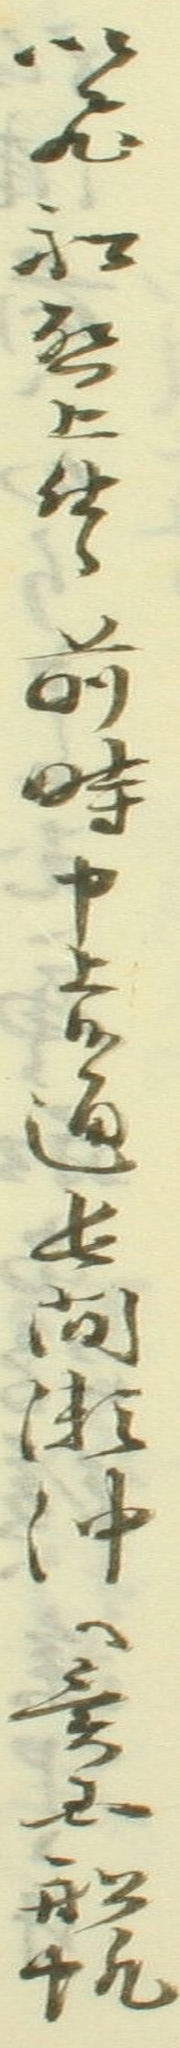以尤私啓上仕候前時申上候通長間瀬沖へ異国船帆
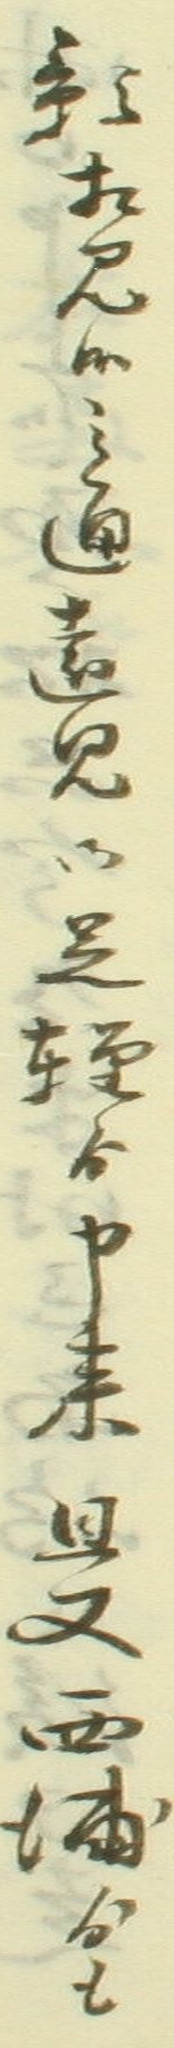類相見候之通遠見御足軽ゟ申来且又西浦ゟも
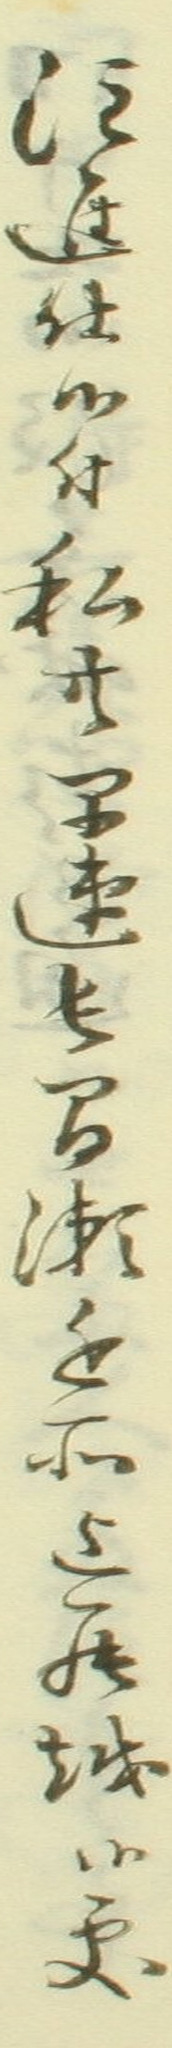注進仕候付私共早速長間瀬近所迄罷越候処
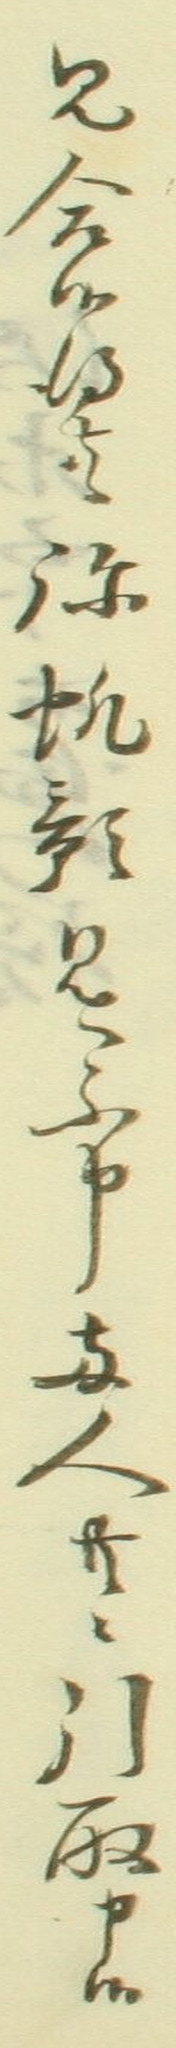見合候得共弥帆類見へ不申両人共に引取申候
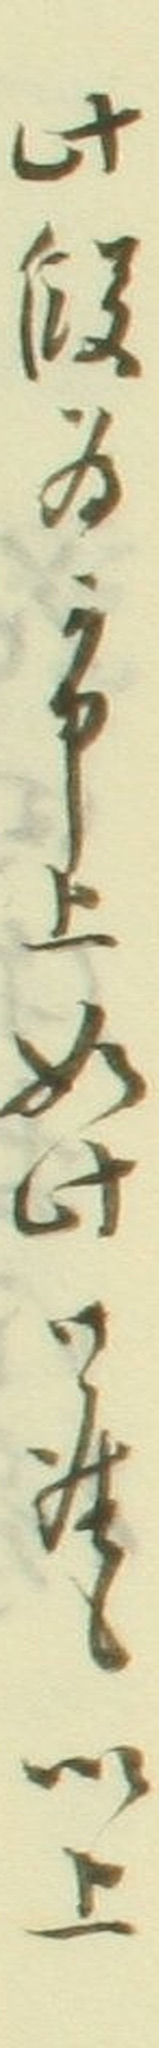此段為可申上如此御座候以上
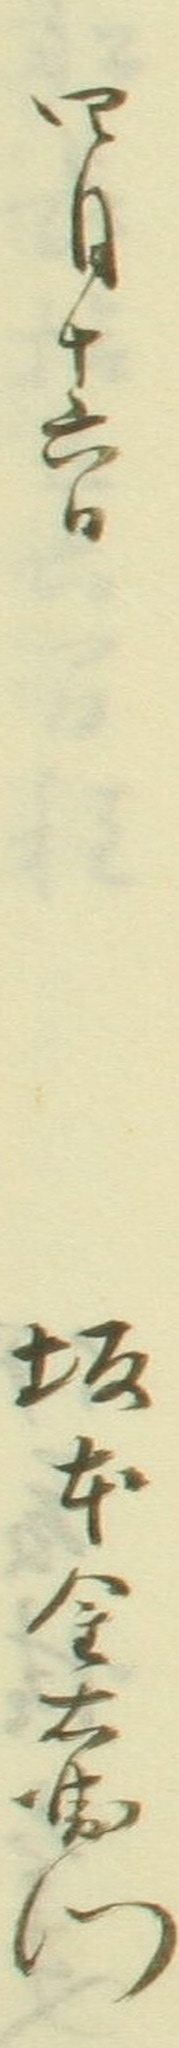四月十六日坂本金右衛門

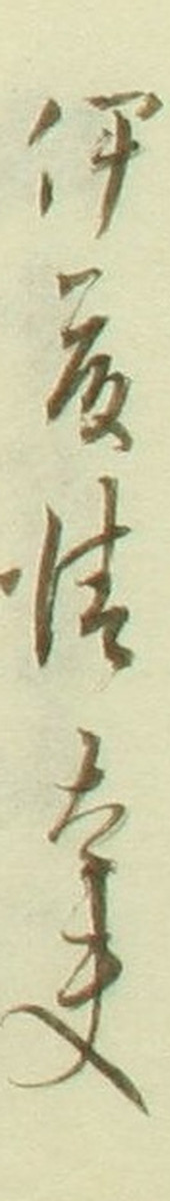伊藤清太夫
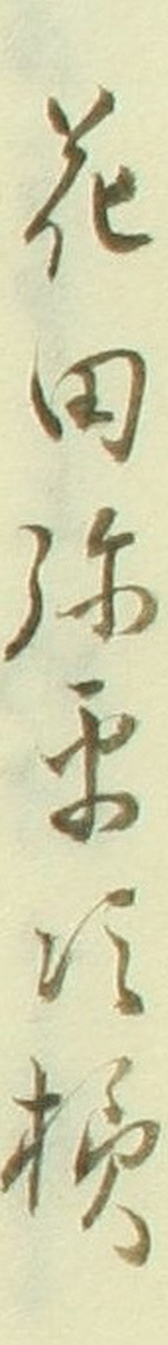花田弥平次様
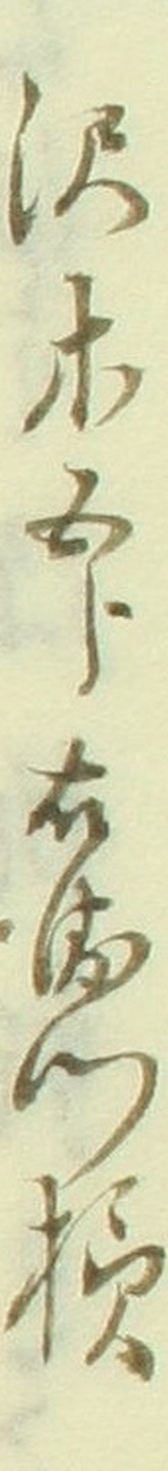沢木五郎右衛門様
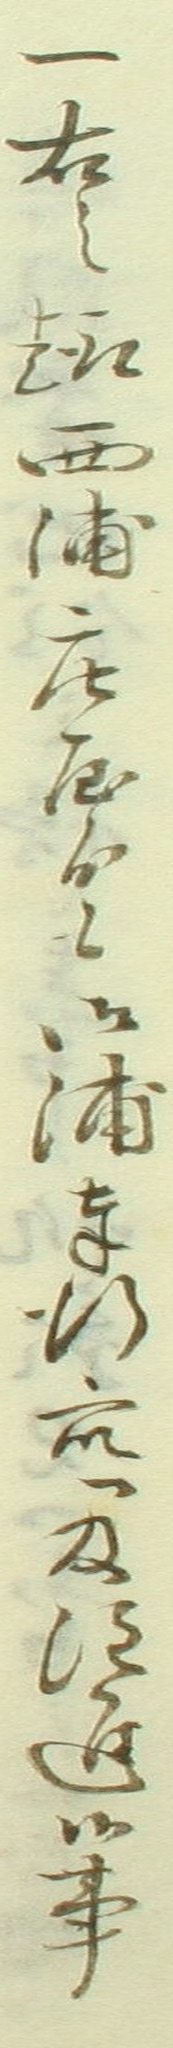一右之趣西浦庄屋ゟ之御浦奉行衆へ及注進候事
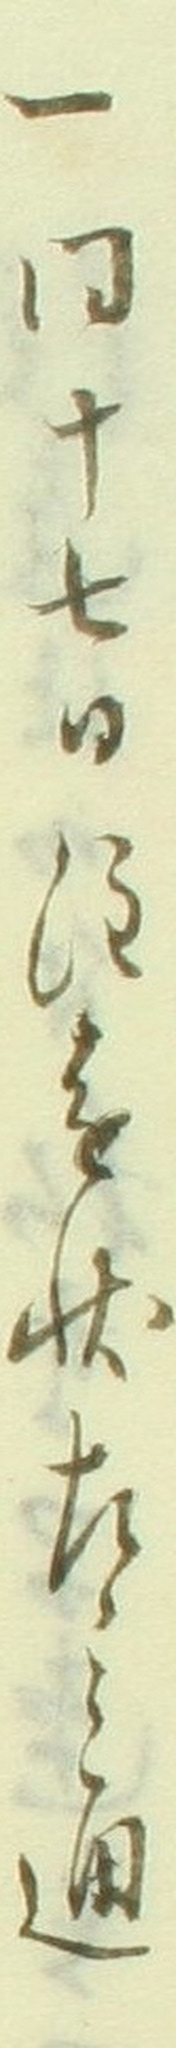一同十七日注進状左之通
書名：異国船漂着記
